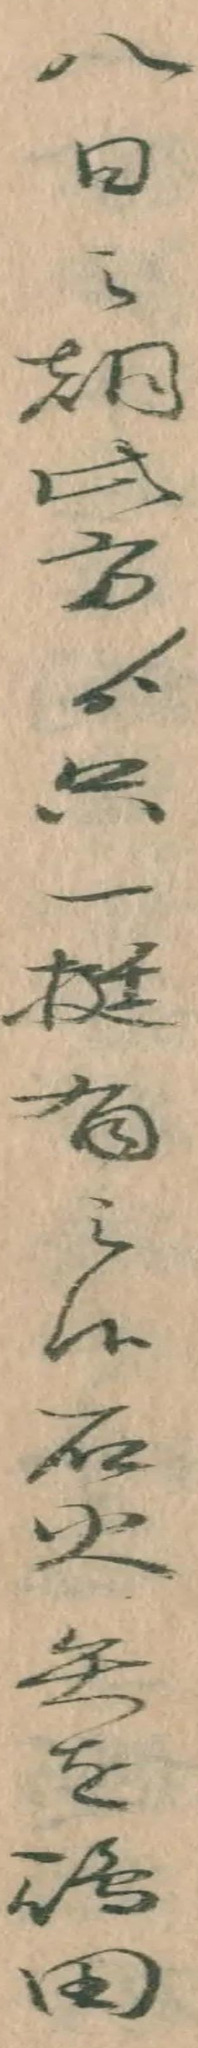八日之朝此方ゟ只一挺有之候石火矢を島田
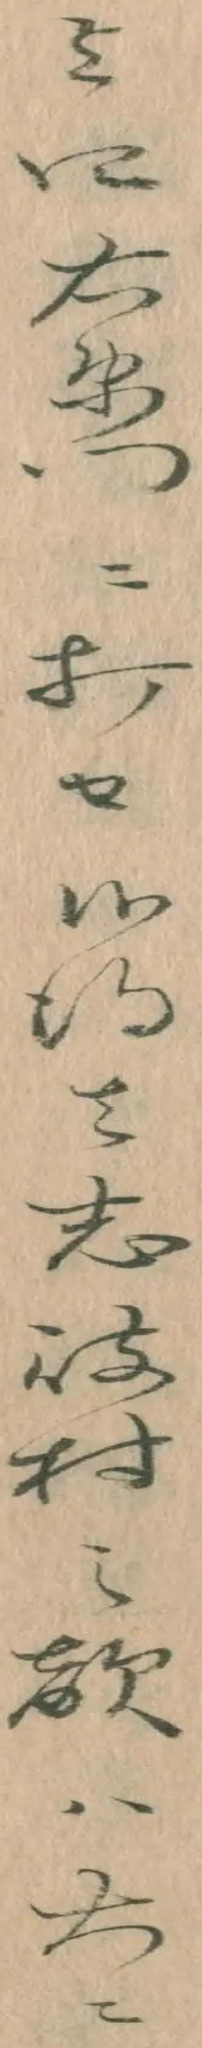与四右衛門に打セ候得は志岐村之敵は大に
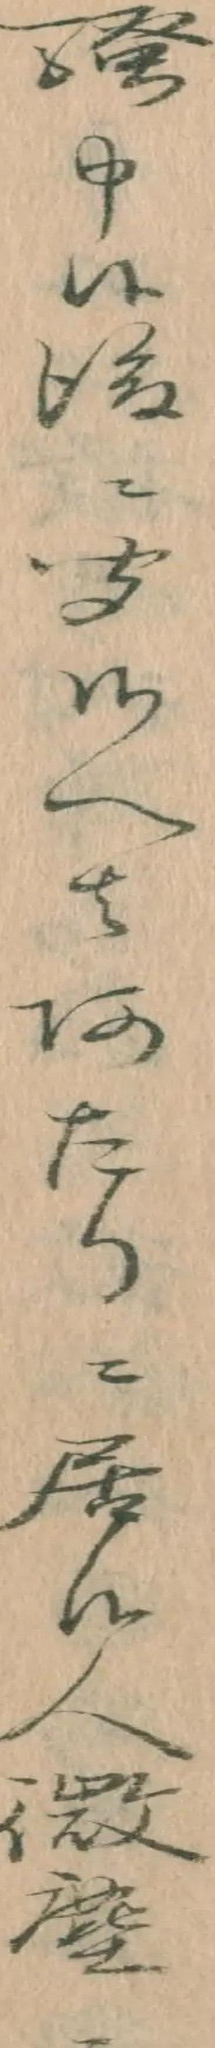騒申候後に聞候へはあたりに居候人微塵に
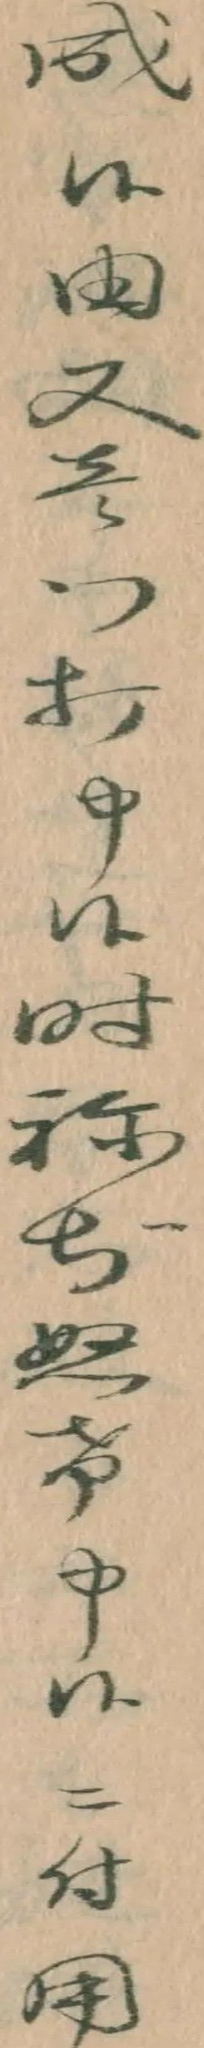成候由又壱ツ打申候時ねじぬけ申候に付用
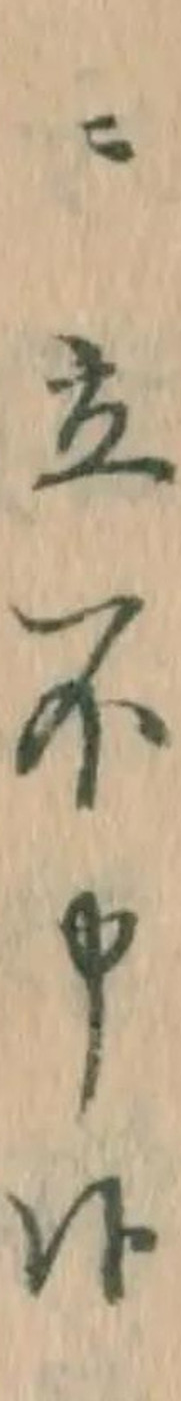に立不申候
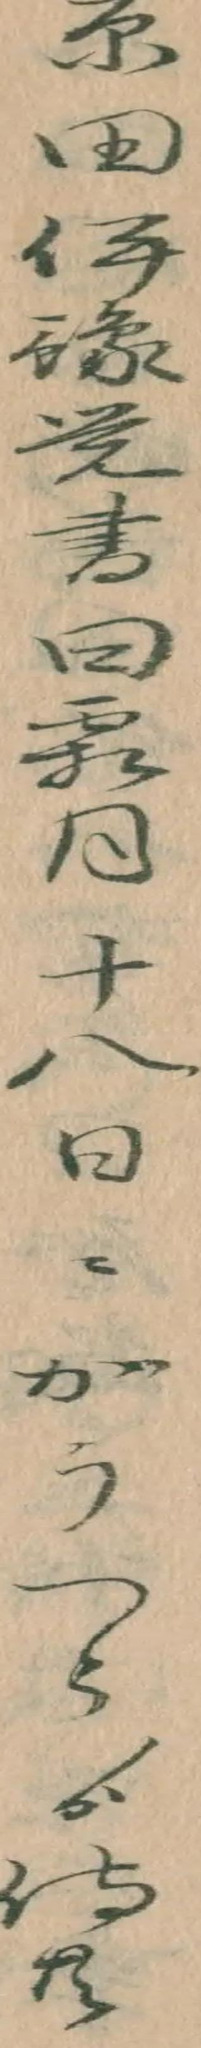原田伊予覚書曰霜月十八日にがうつらゟ侍共
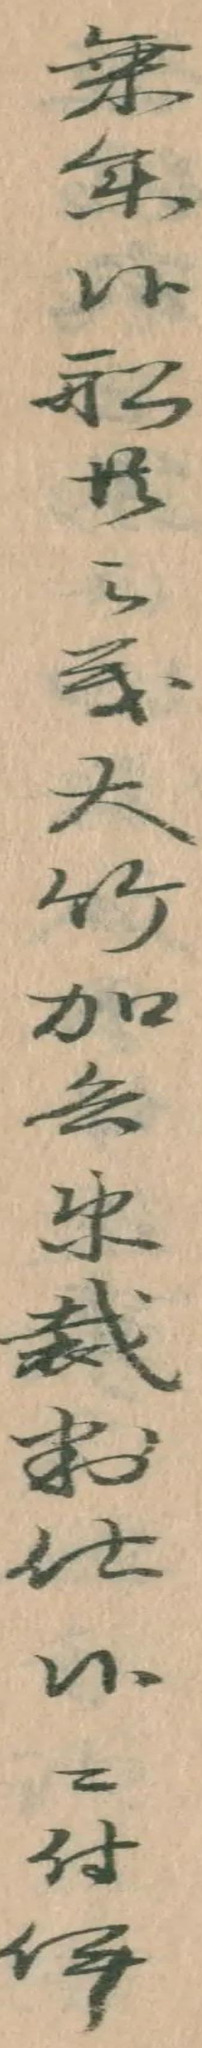乗参候船共之義大竹加兵衛裁判仕候に付伊
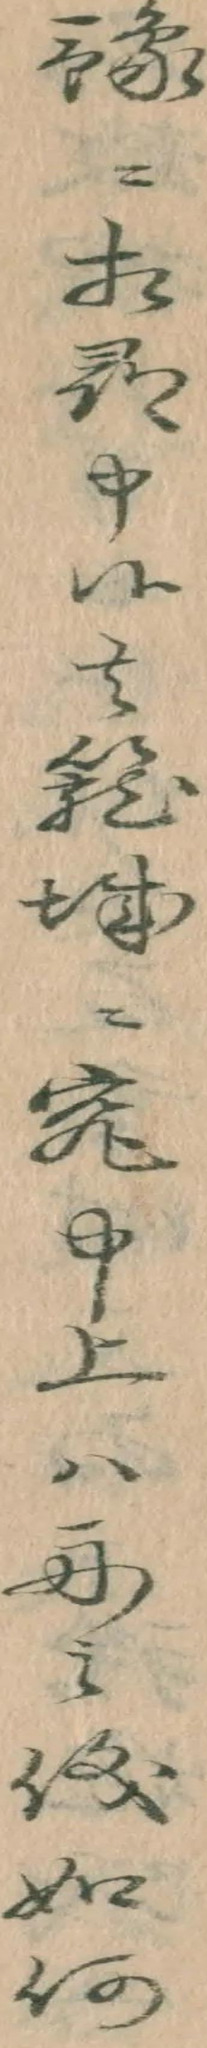予に相尋申候は籠城に究申上は舟之儀如何
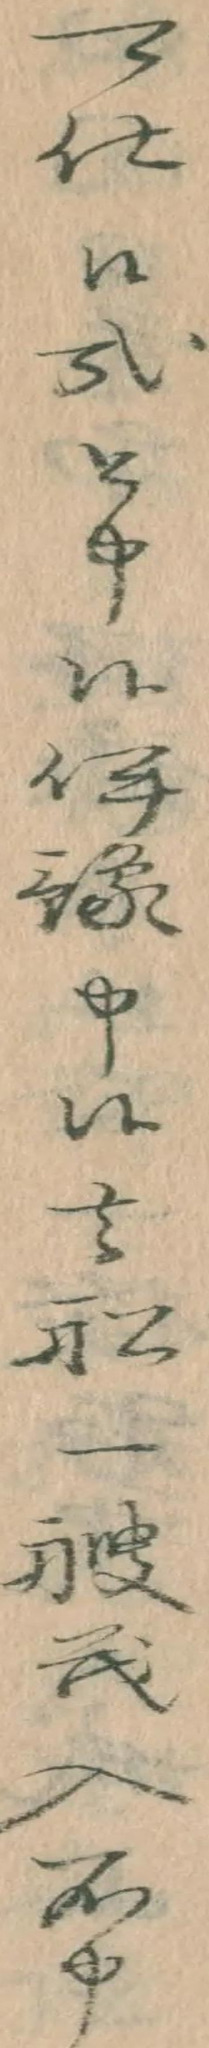可仕候哉と申候伊予申候は船一艘も入不申
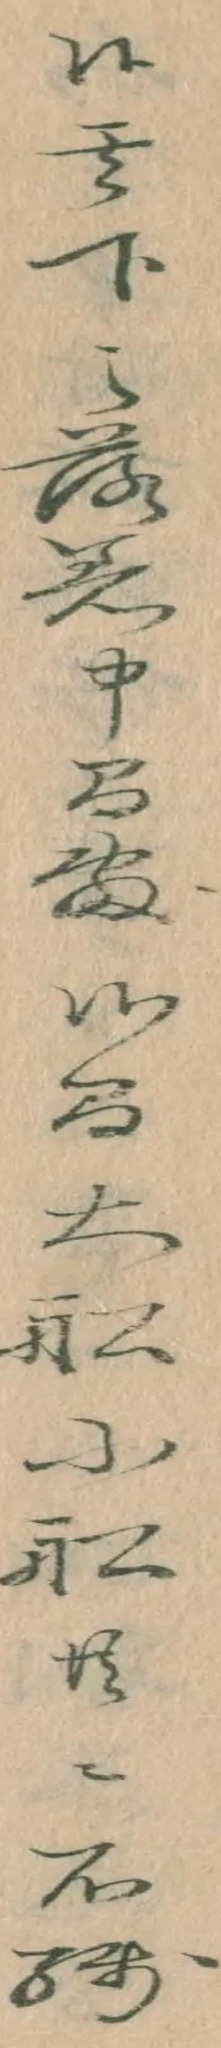候其下之落着申間敷候間大船小船共に不残
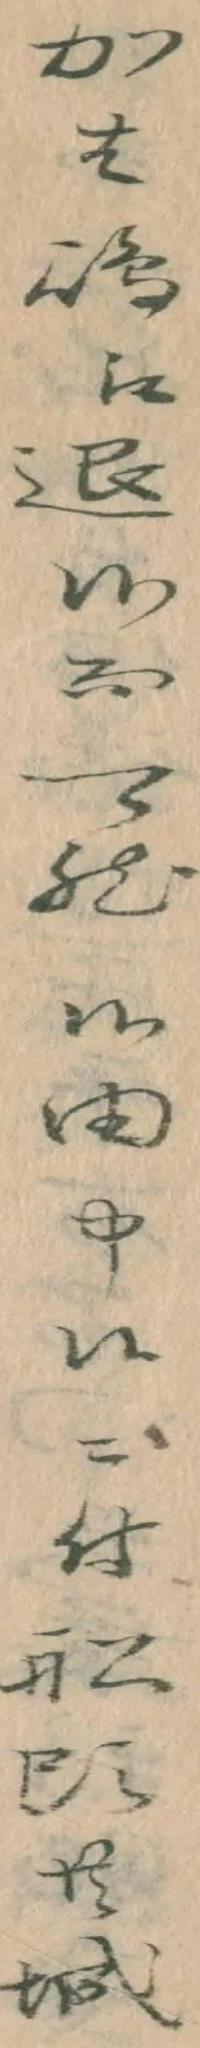加は島江退候而可然候由申候に付船頭共城
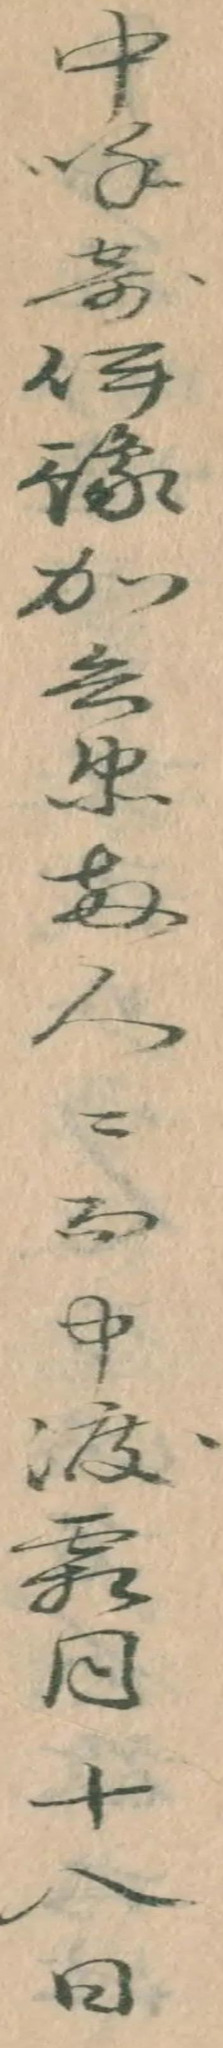中呼寄伊予加兵衛両人に而申渡霜月十八日
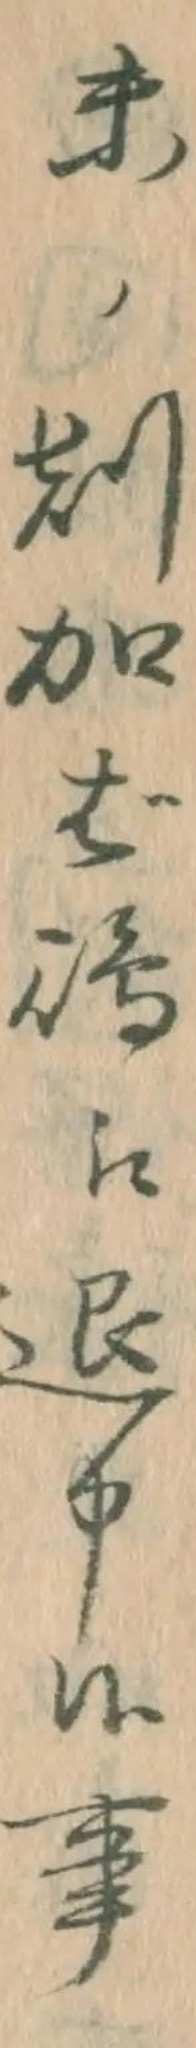未ノ刻加ば島江退申候事

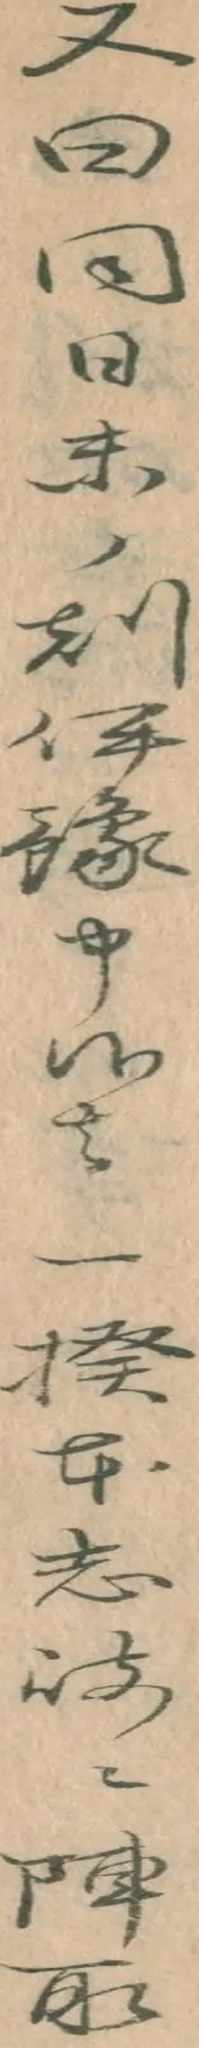又曰同日未ノ刻伊予申候は一揆本志岐に陣取
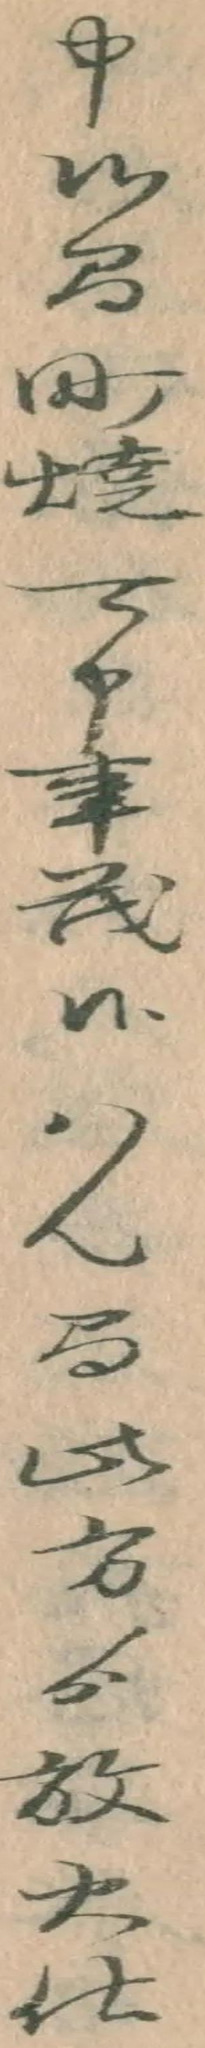申候間町焼可申事も候はん間此方ゟ放火仕
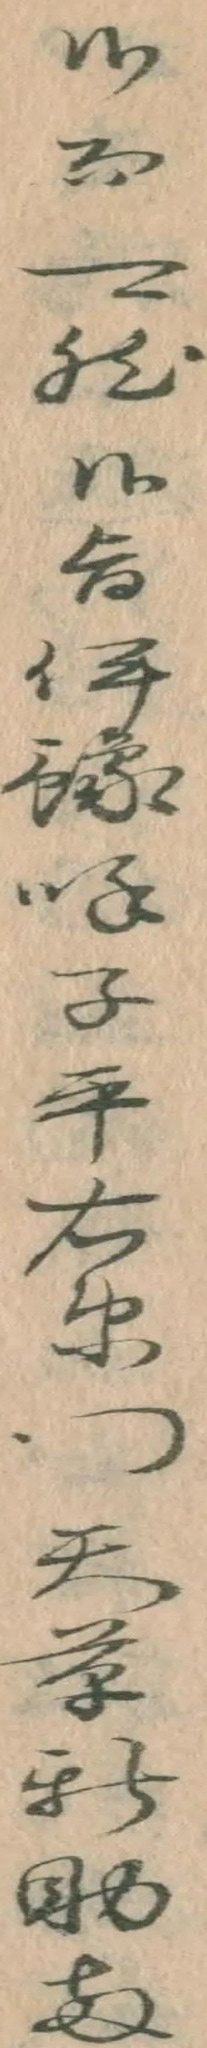候而可然候旨伊予呼子平右衛門天草新助両
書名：切支丹御退治記 49巻. [3]
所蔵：国立国会図書館 National Diet Library, JAPAN
